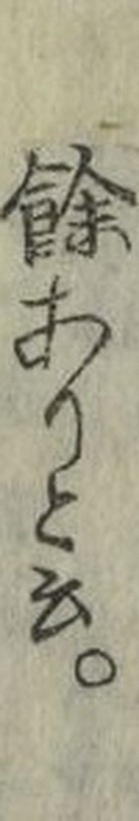餘ありと云。

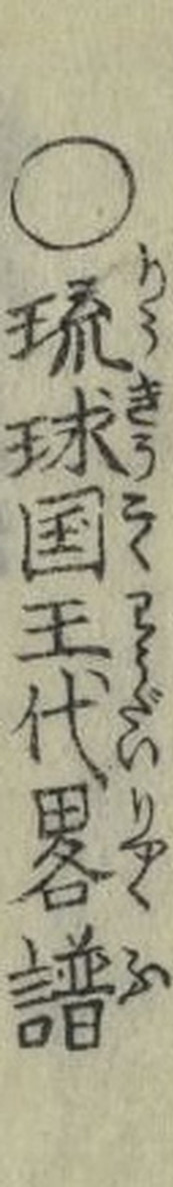〇琉球国王代畧譜
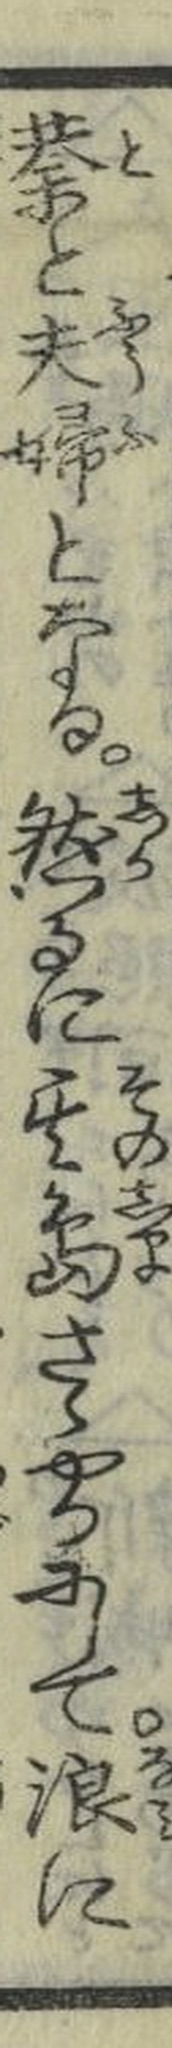㭟と夫婦となる。然るに其島さゝやかにして。浪に
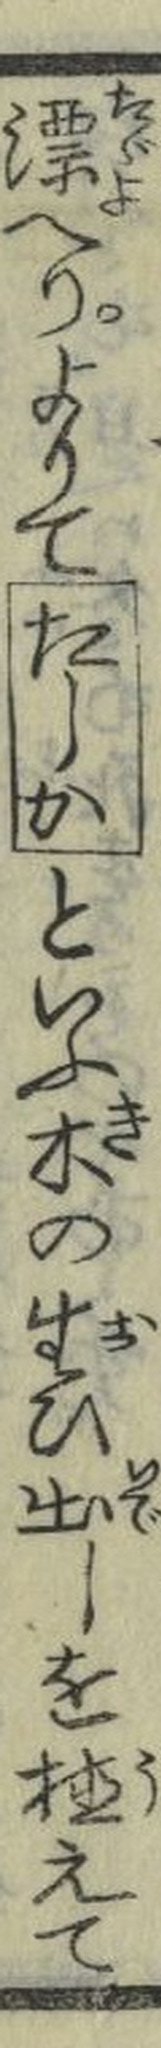漂へり。よりて[たしか]といふ木の生ひ出しを植えて
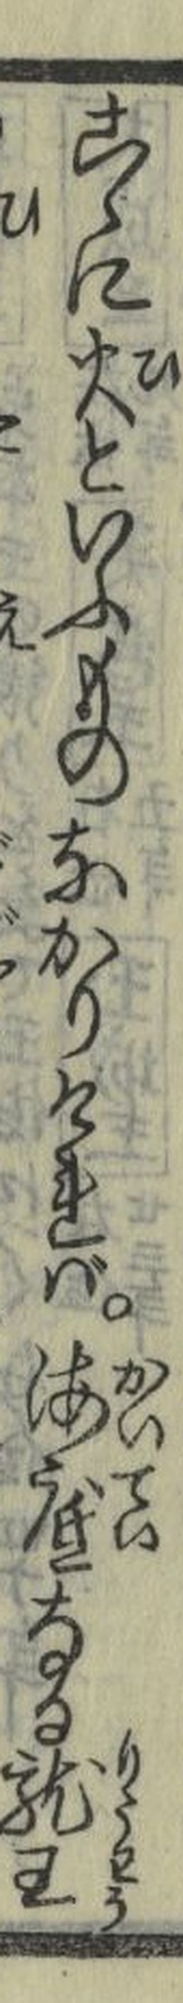こゝに火といふものなかりけれバ。海底なる龍王
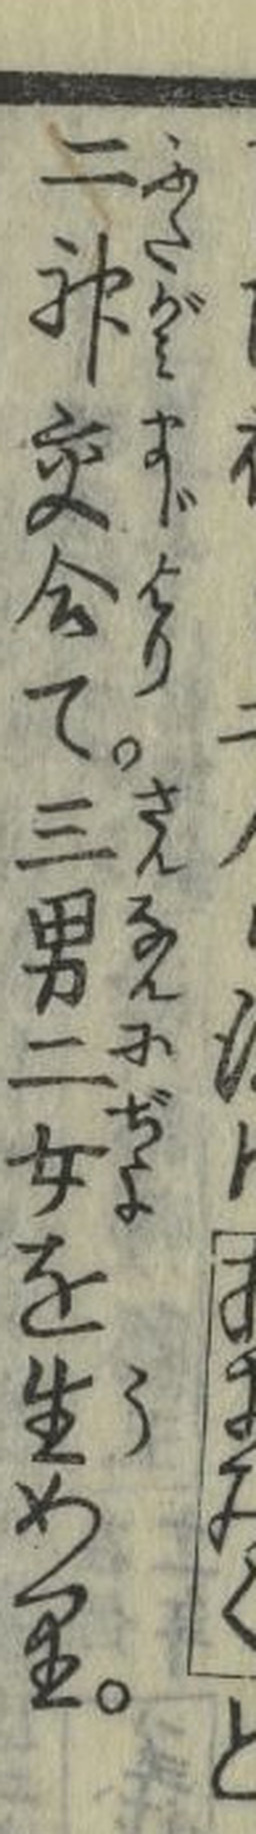二神交合て。三男二女を生めり。

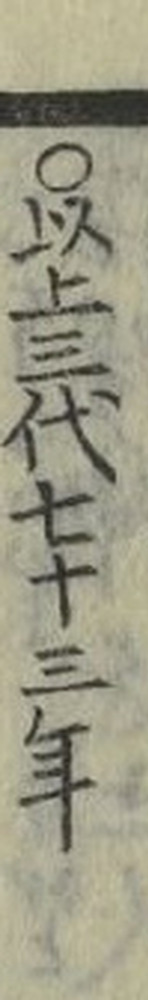〇以上三代七十三年
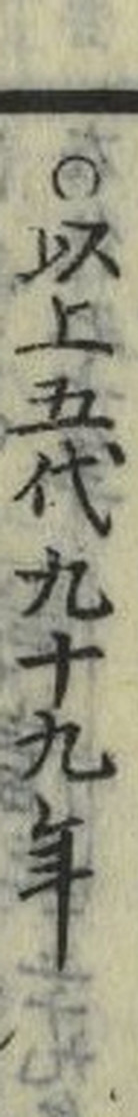〇以上五代九十九年
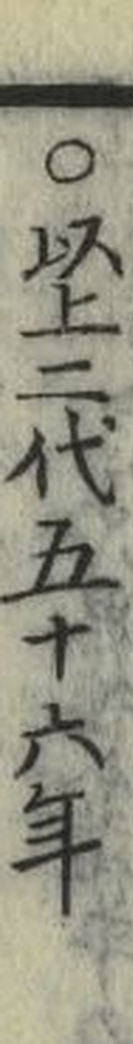〇以上二代五十六年

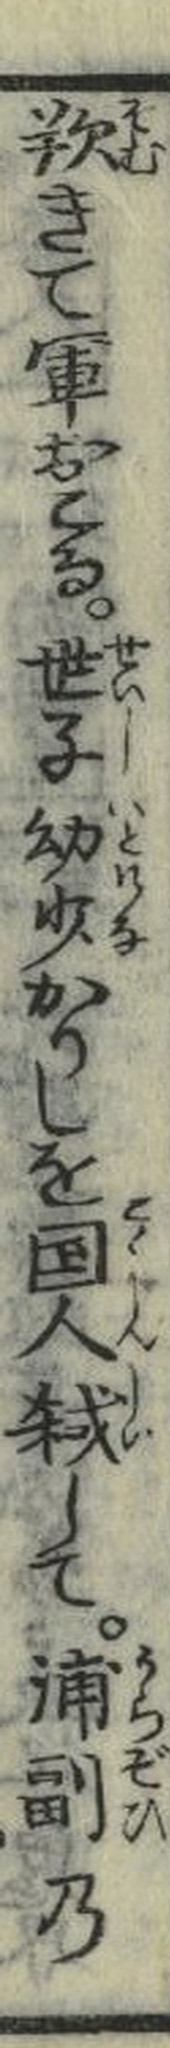叛きて軍おこる。世子幼少かりしを国人弑して。浦副の
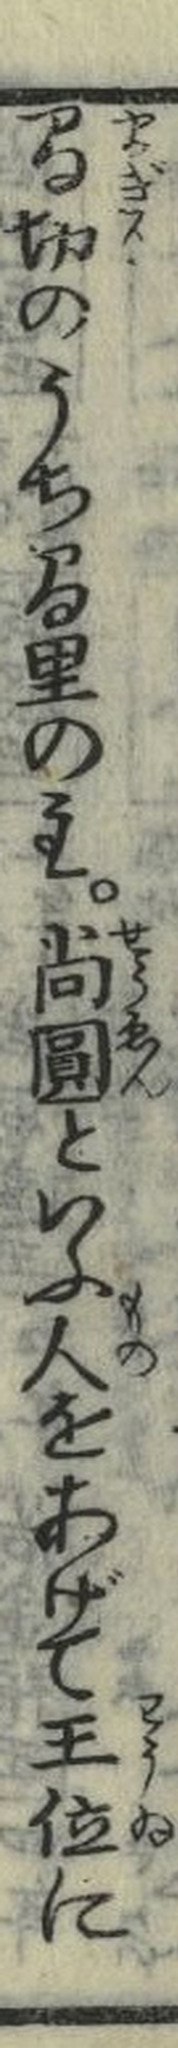間切のうち間里の主。尚圓といふ人をあげて王位に
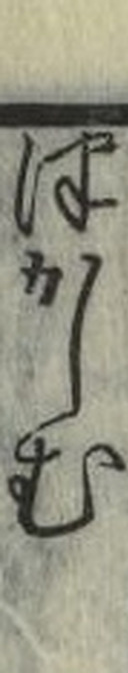つかしむ
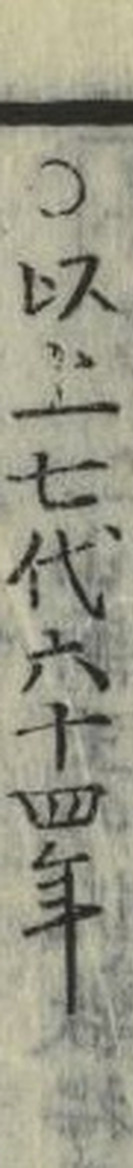〇以上七代六十四年
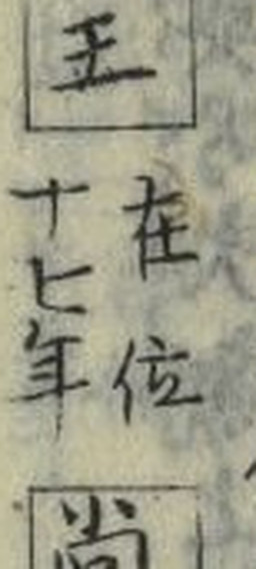三十七年
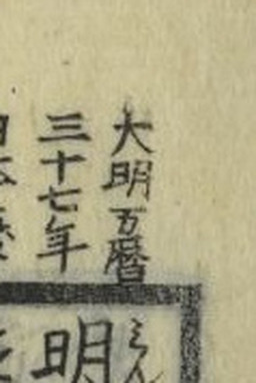大明万暦
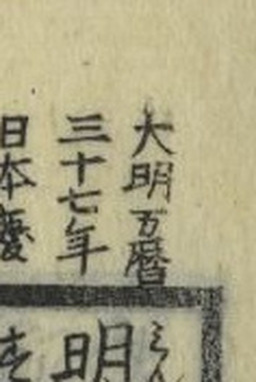大明万暦
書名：琉球奇譚
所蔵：University of the Ryukyus Library
